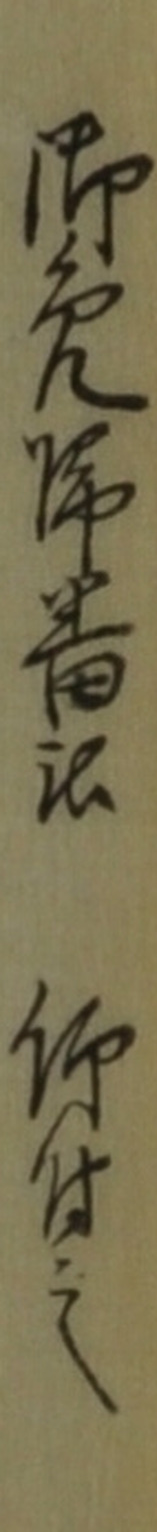御免帰番被仰付之
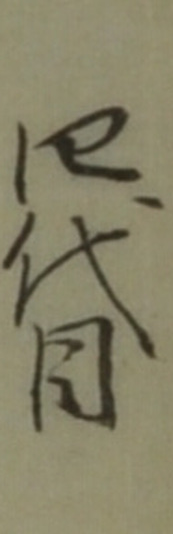四代目
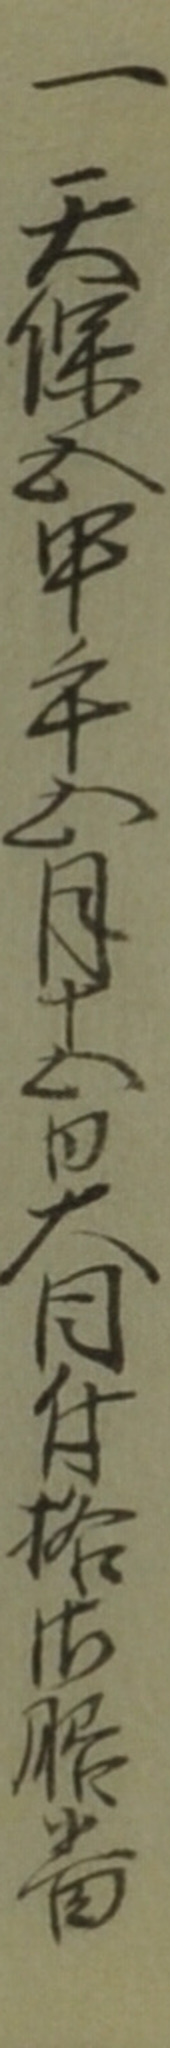一天保五申午五月十五日大目付格御膳番
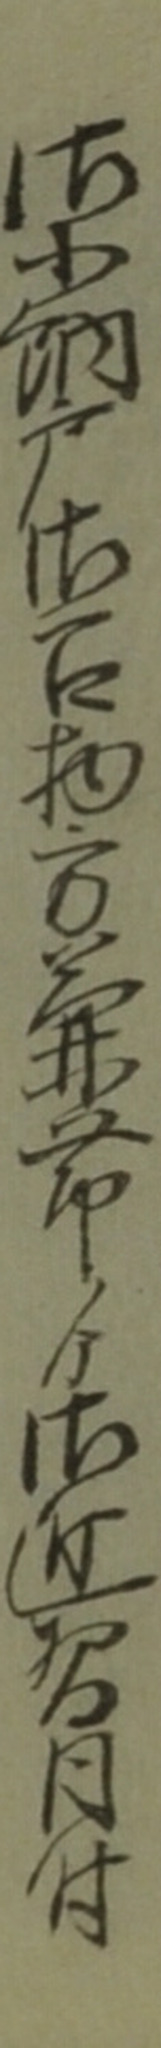御小納戸御召物方兼帯ゟ御近習目付
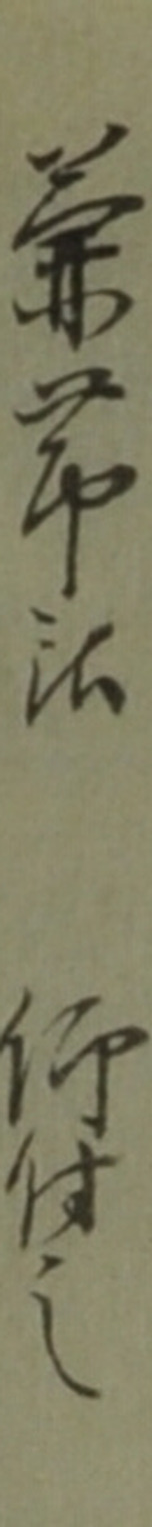兼帯被仰付之
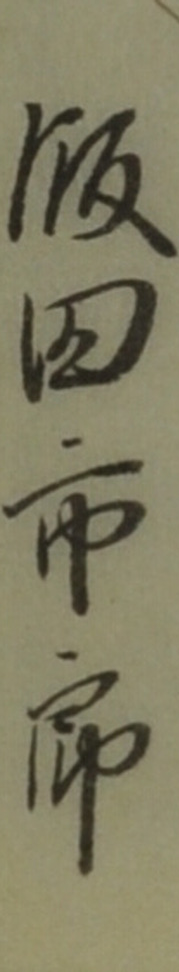飯田市郎
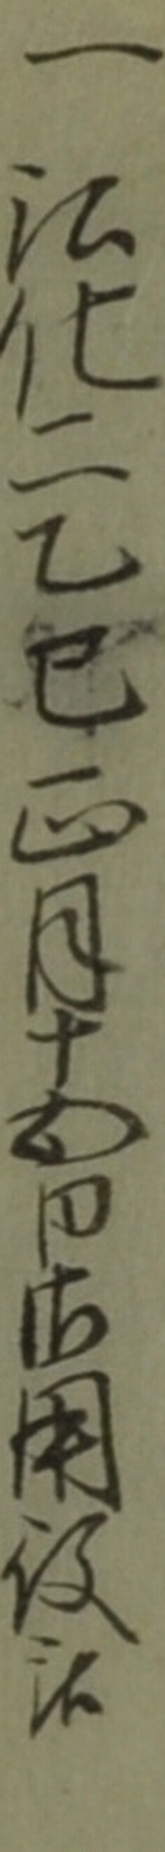一弘化二乙巳正月十五日御用役被
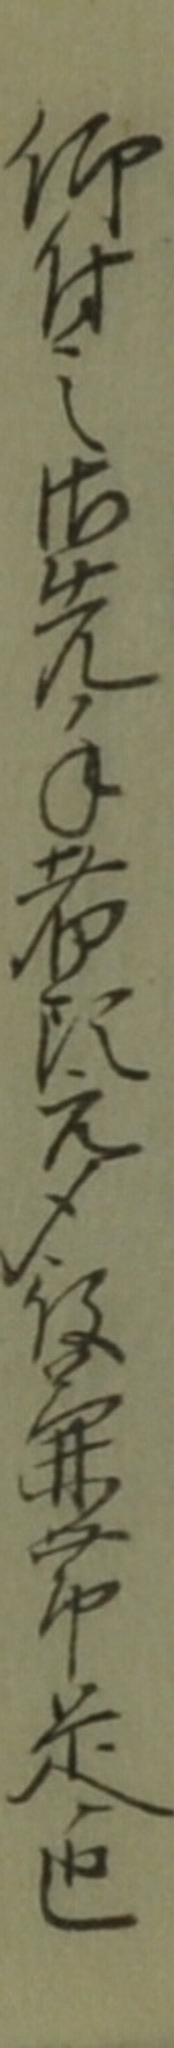仰付之御先手者頭元〆役兼帯是迄
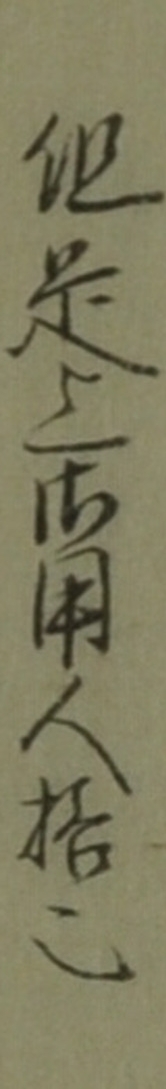但是迄御用人格也
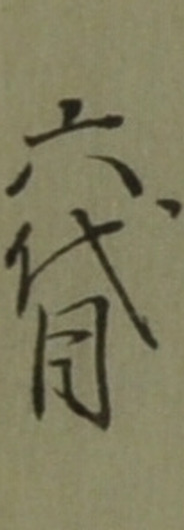六代目
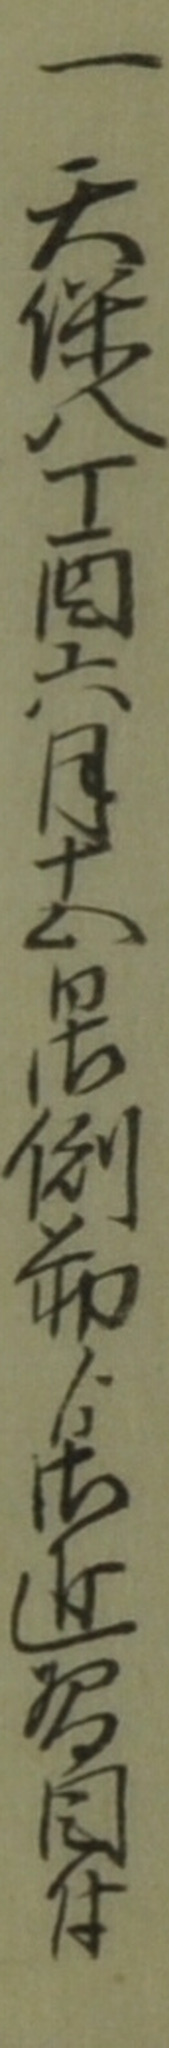一天保八丁酉六月十五日御側勤ゟ御近習目付
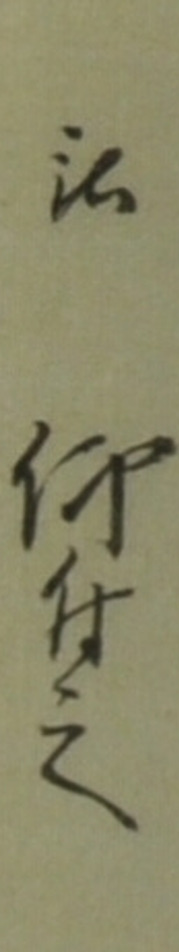被仰付之
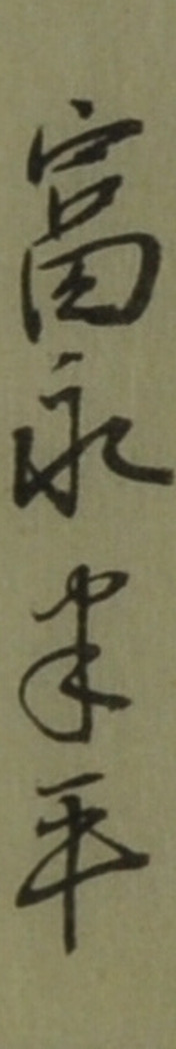富永半平

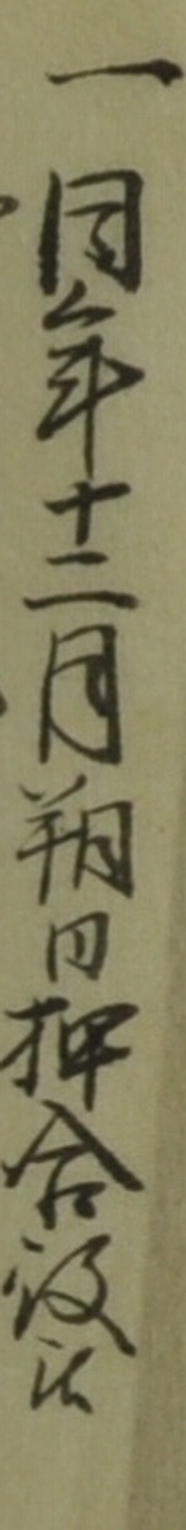一同年十二月朔日押合役被
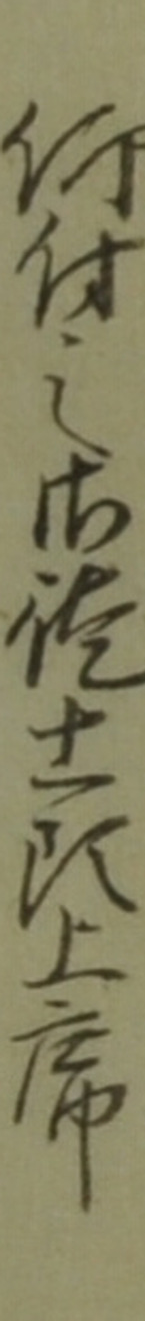仰付之御徒士頭上席
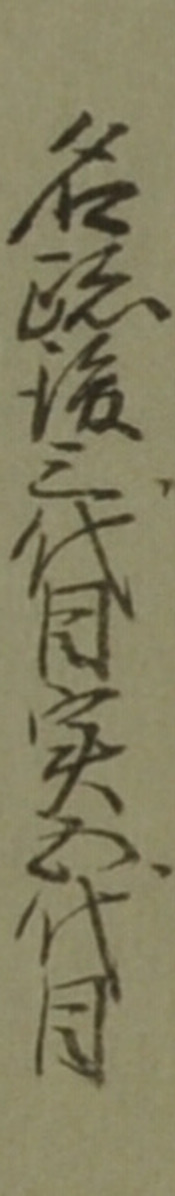名跡後三代目実五代目
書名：諸御役代々録（四）
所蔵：伊那市立高遠町図書館・合同会社AMANE
